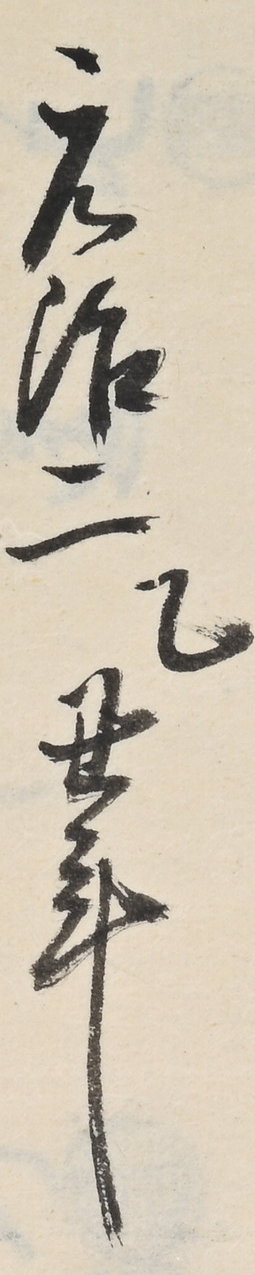元治二乙丑年
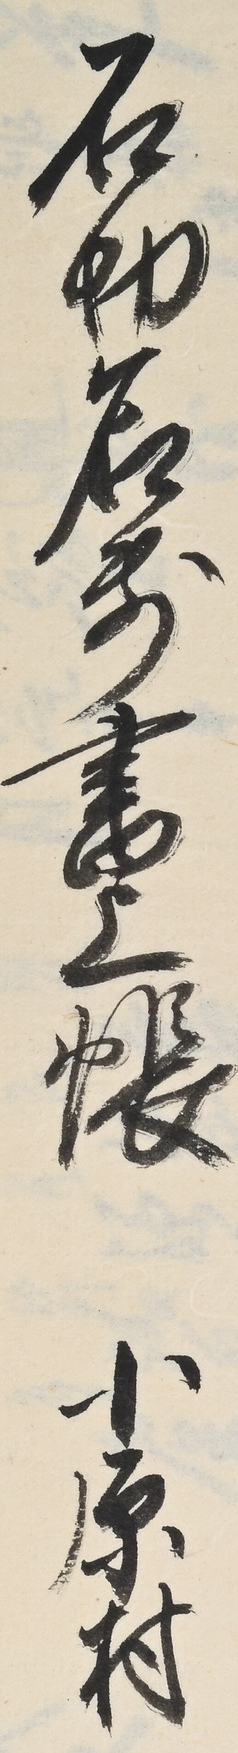石切名前書上帳小原村

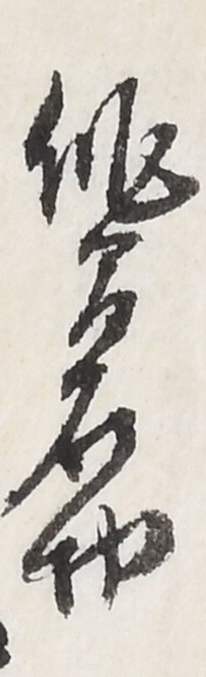作間石切
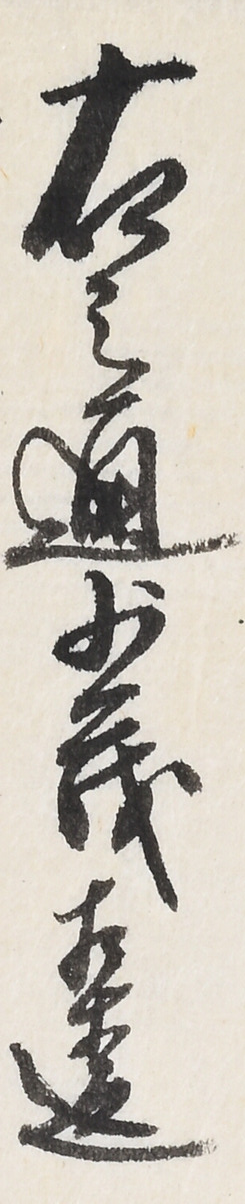右之通少茂相違
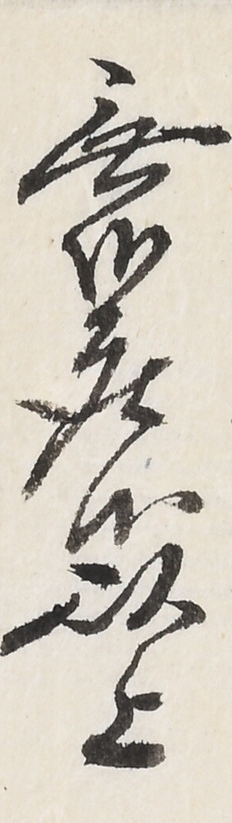無御座候以上
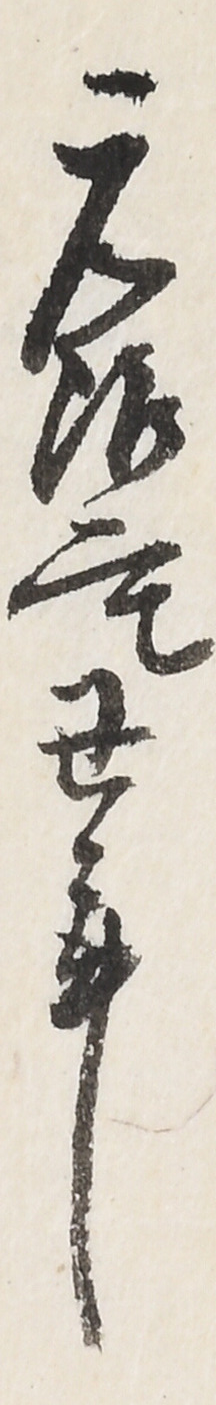元治二乙丑年
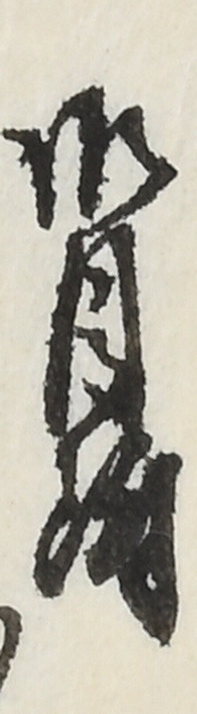御目付
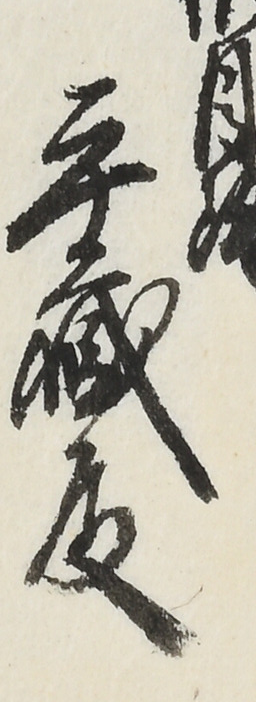平蔵殿
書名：元治二乙丑年三月石切名前書上帳
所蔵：伊那市立高遠町図書館・合同会社AMANE
